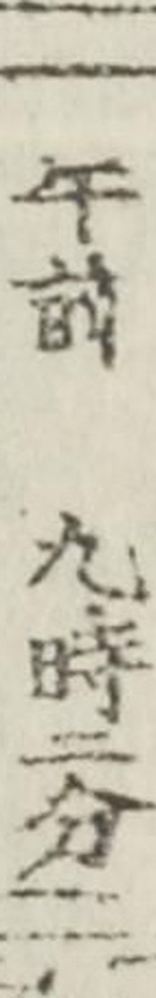午前九時二分
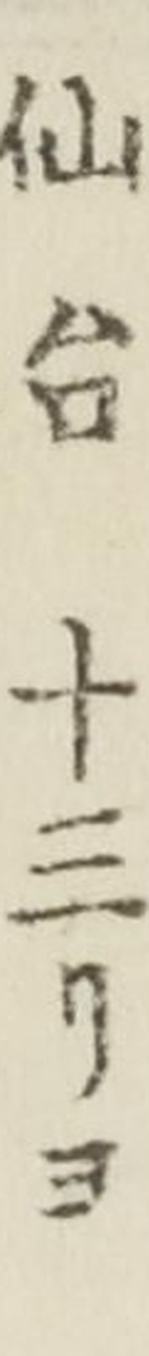距仙台十三リヨ
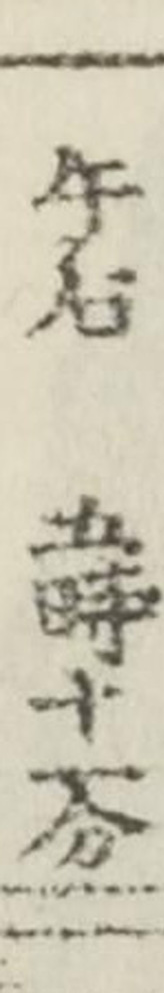午后五時十一分
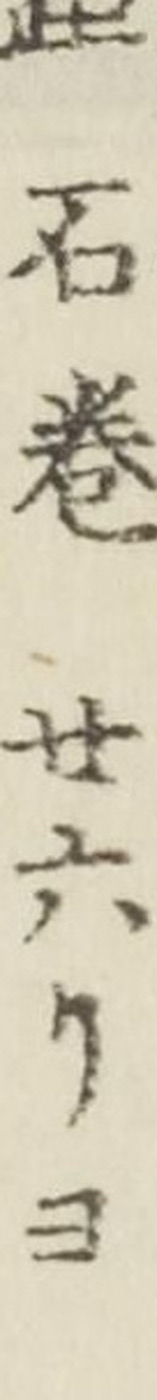距石巻廿六リヨ
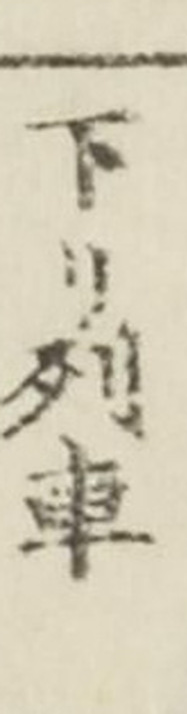下リ列車
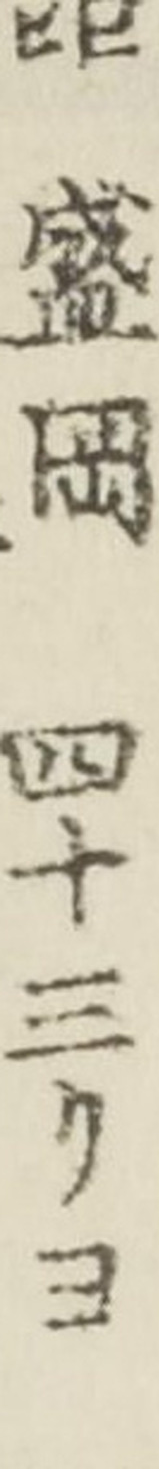距盛岡四十三リヨ
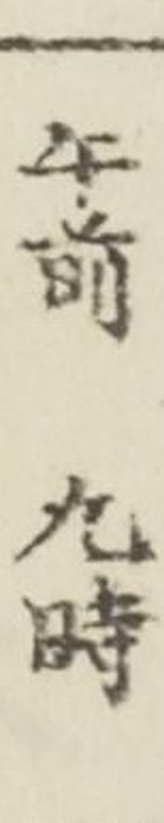午前九時
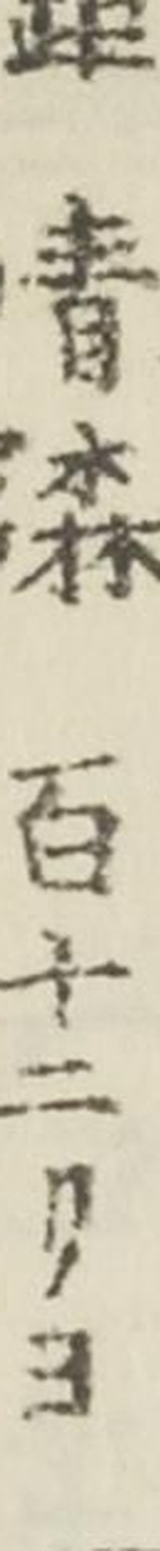距青森百十ニリヨ
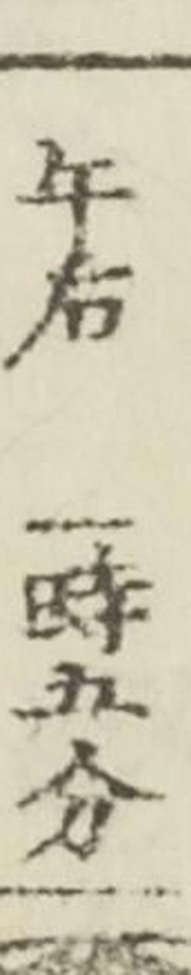午后一時五分
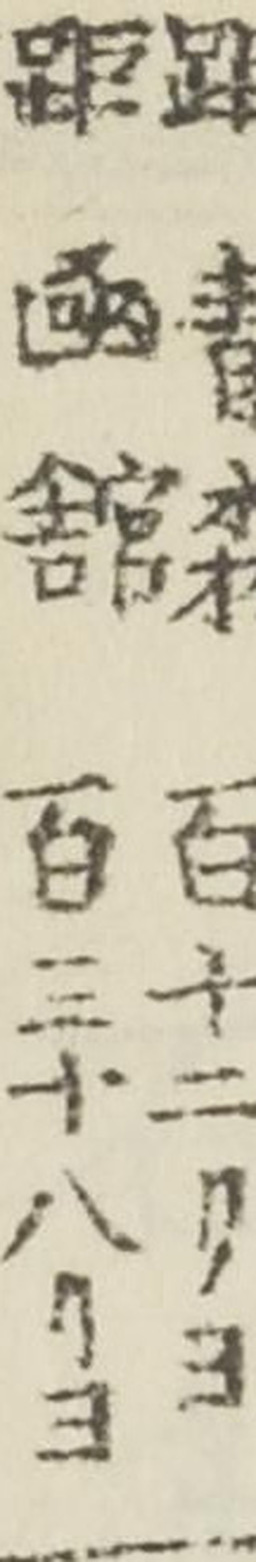距函館百三十八リヨ
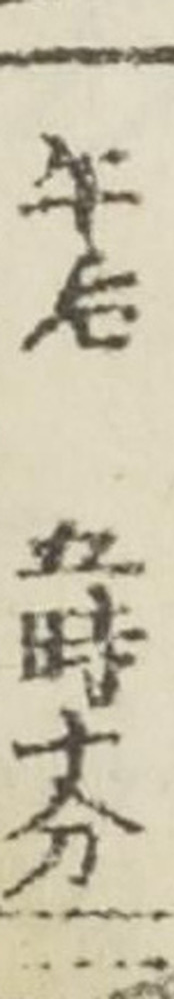午后五時十分
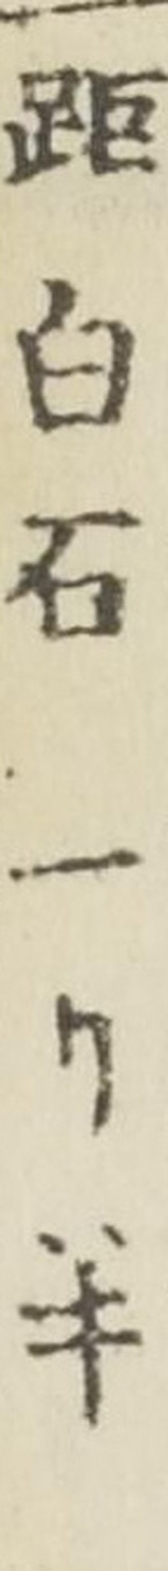距白石一リ半
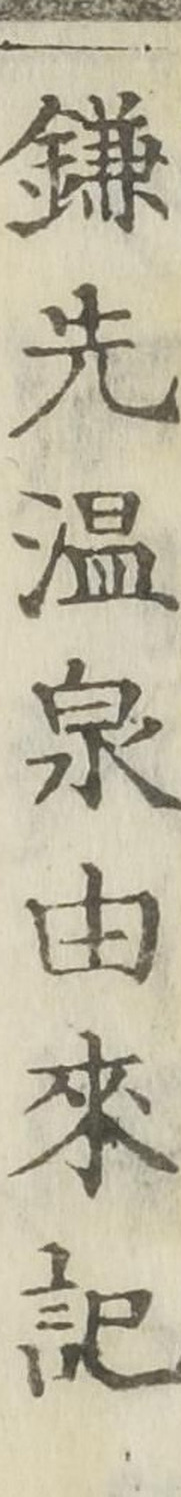鎌先温泉由来記
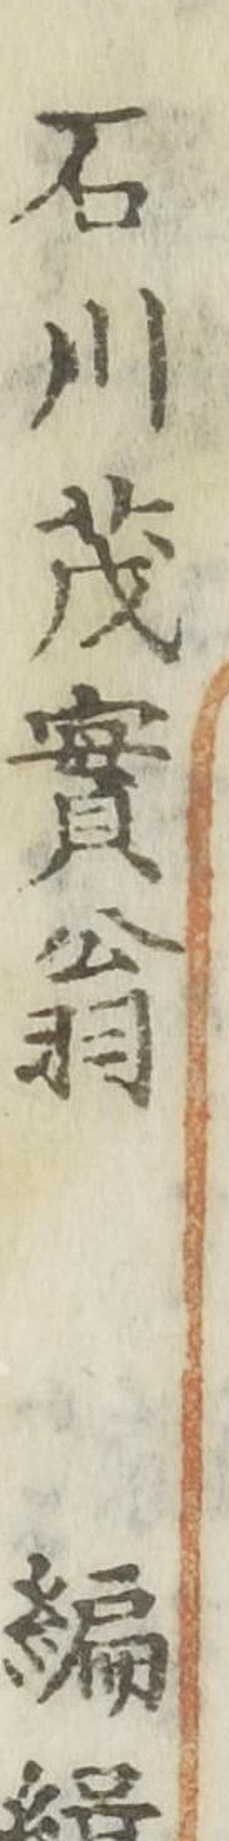石川茂実翁編緝
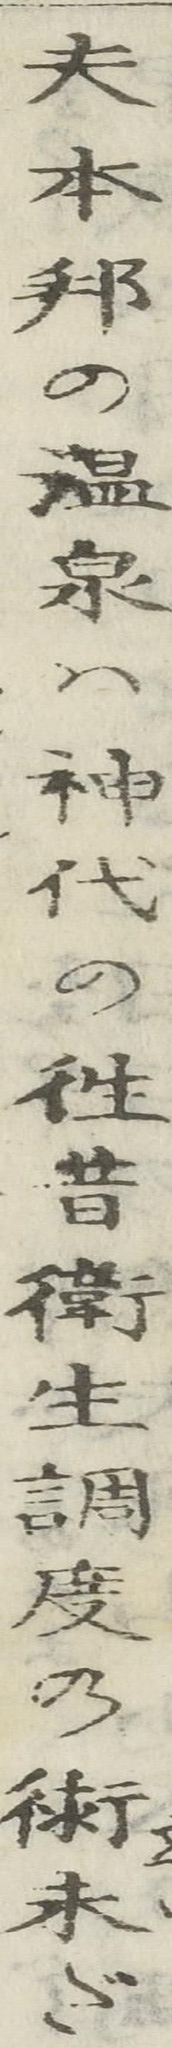夫本邦の温泉は神代の往昔衛生調度の術未だ
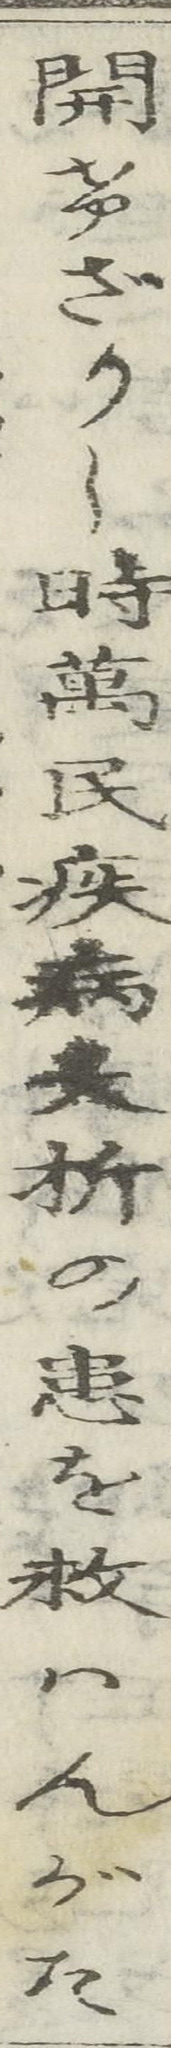開けざりし時万民疾病夭折の患を赦はんがた
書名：鎌先温泉由來記
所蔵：東京大学地震研究所図書室 Earthquake Research Institute Library, The University of Tokyo, JAPAN
